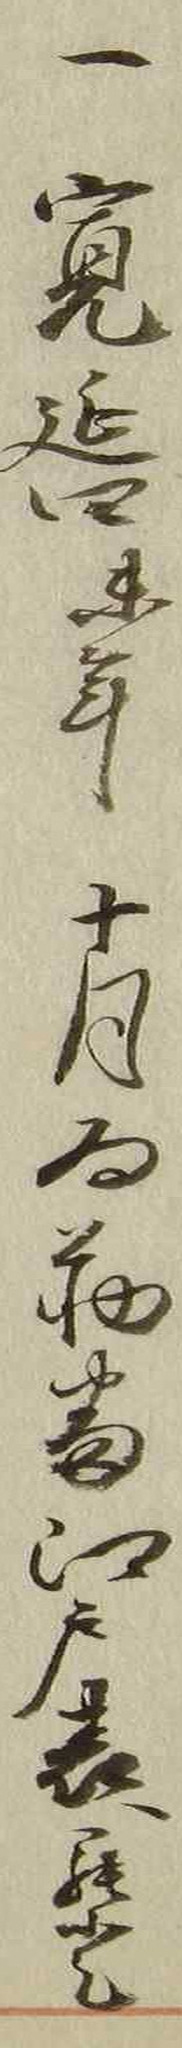一寛延四未年十月為勤番江戸表へ罷登
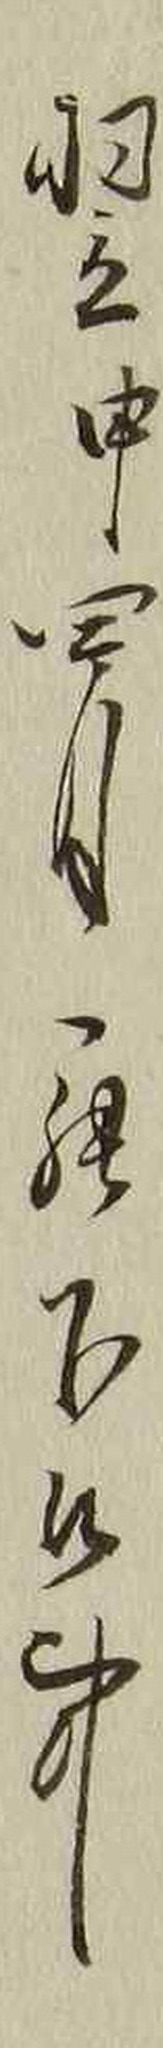翌中四月罷下候事
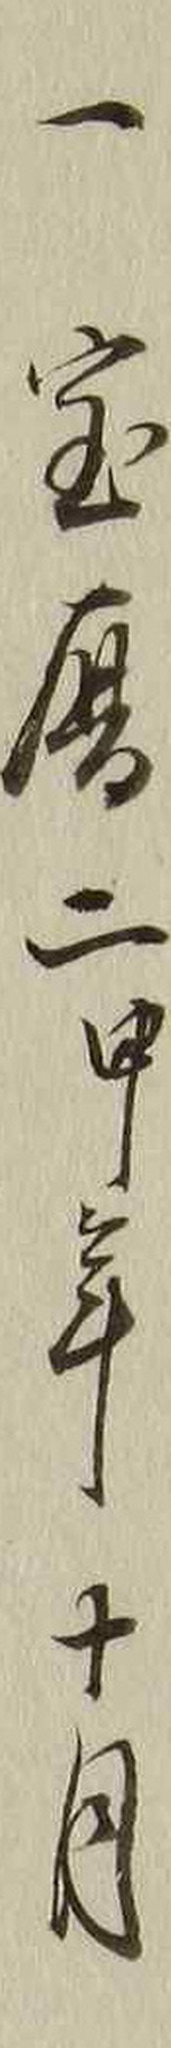一宝暦二申年十月
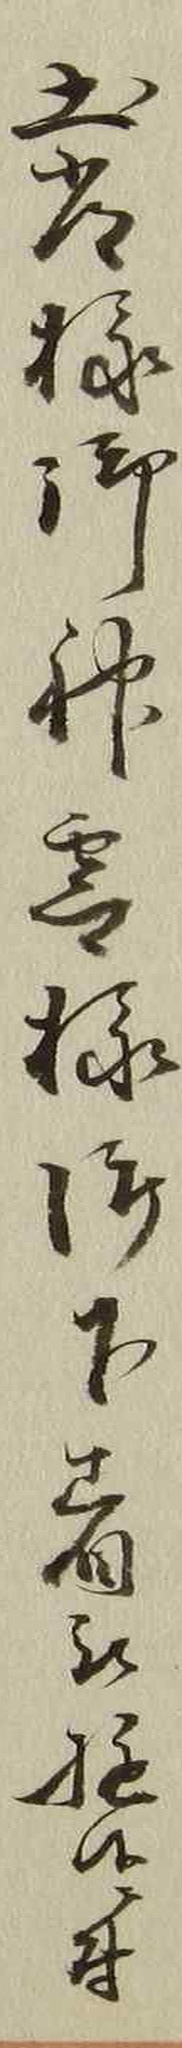土常様御神霊様御下者被遊候ニ付
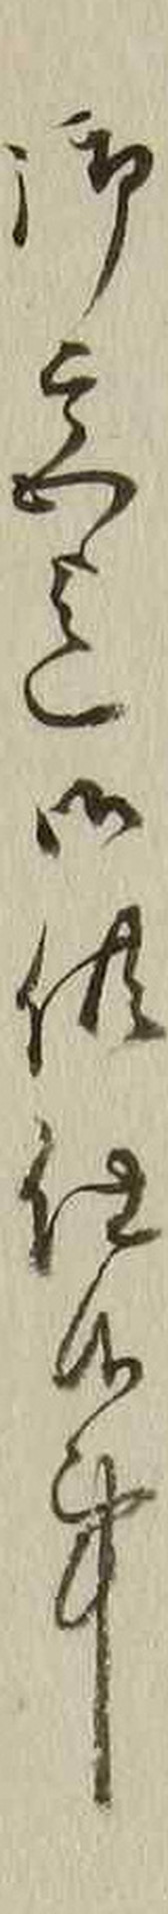御宮迄御供仕候事
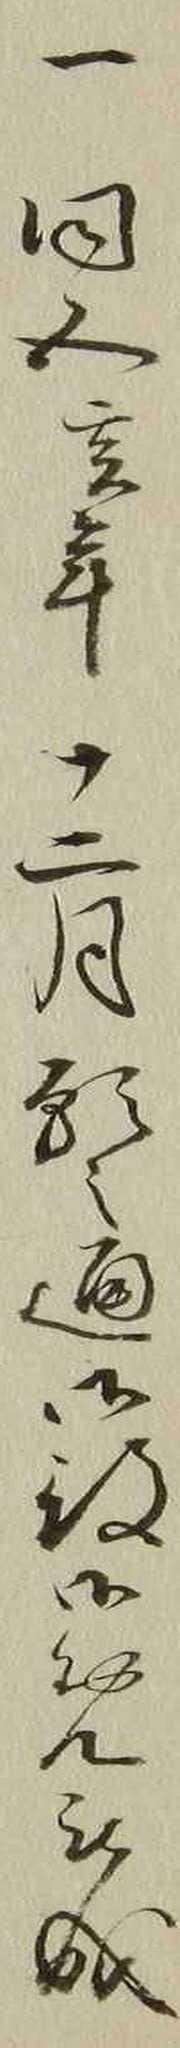一同五亥年十二月願之通御役御免被成
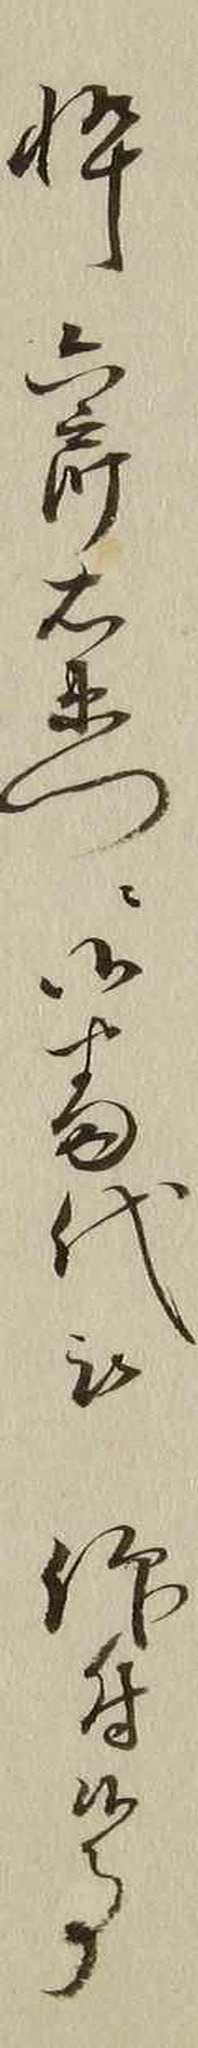忰六郎右衛門ニ御番代被仰付候事
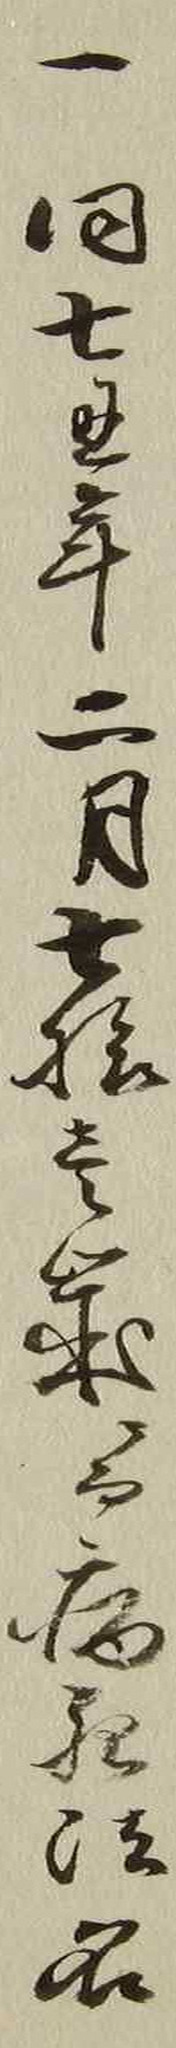一同七丑年二月七拾壱歳ニ而病死法名
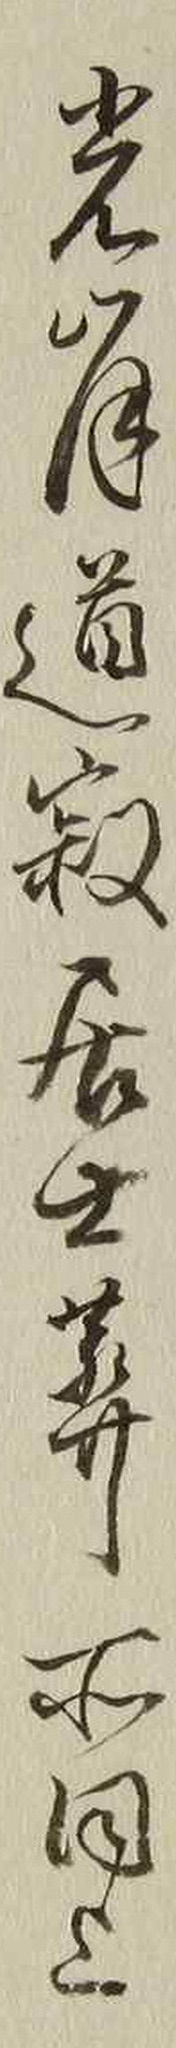光岸道寂居士葬所同上
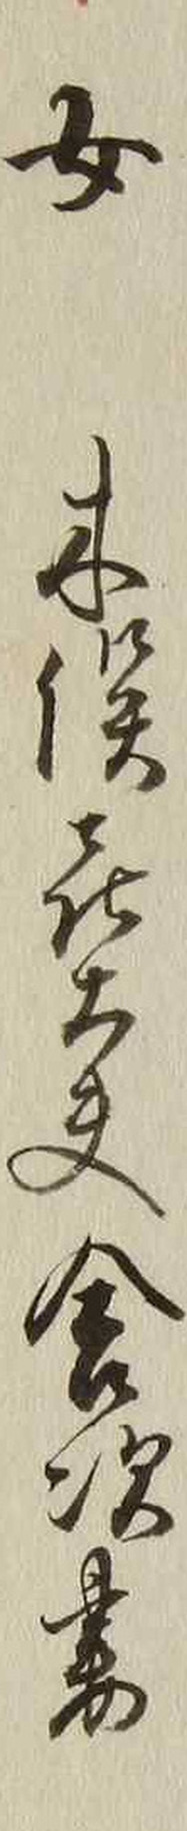女木俣喜大夫舎次妻
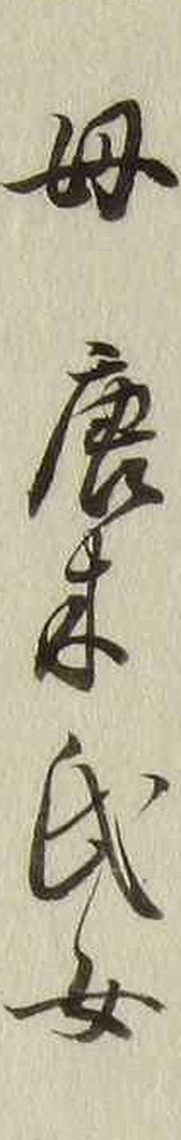母唐木氏女
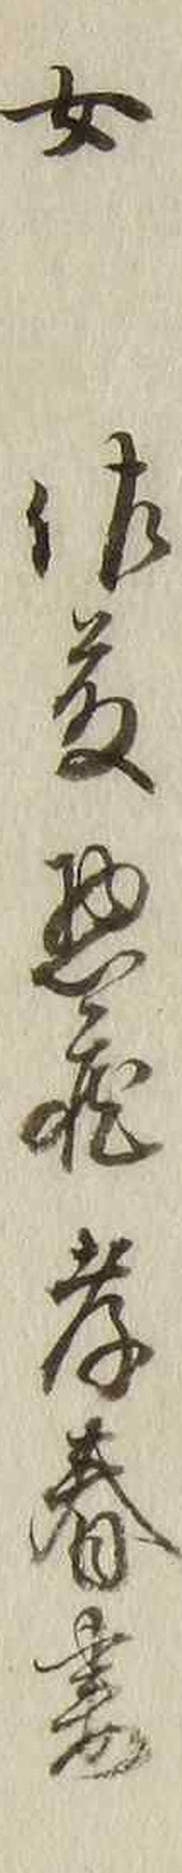女佐藤惣蔵孝春妻
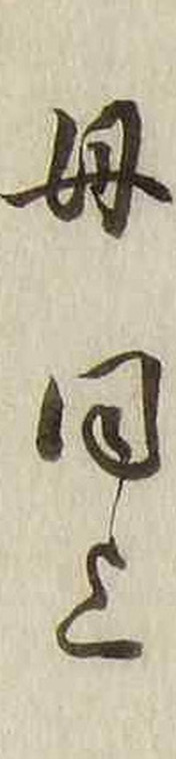母同上

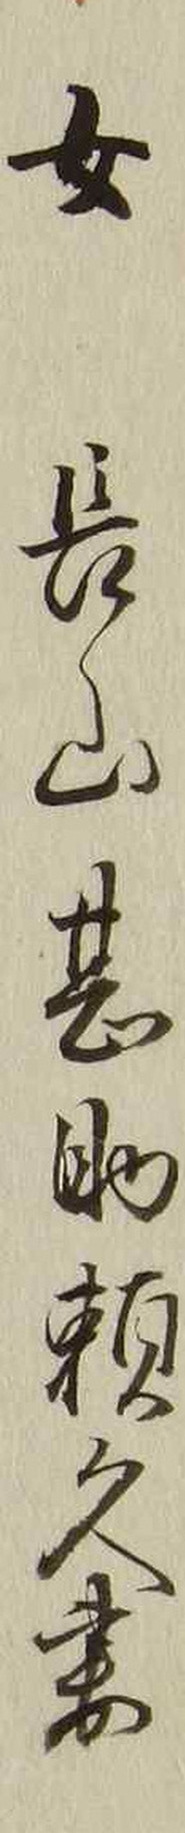女長山甚助頼久妻
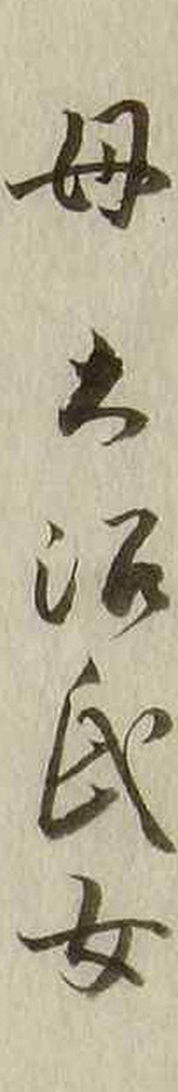母大沼氏女
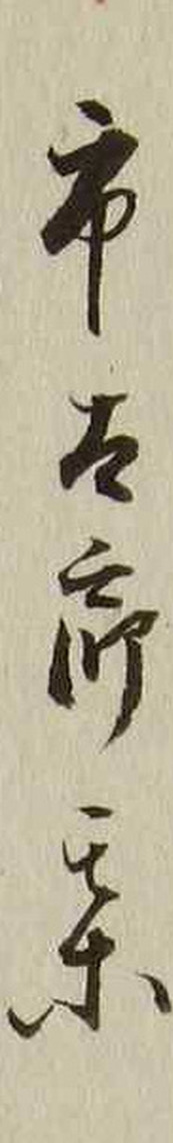市太郎某
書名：諸士系譜　巻之122　よ之部5
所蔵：会津若松市立会津図書館
